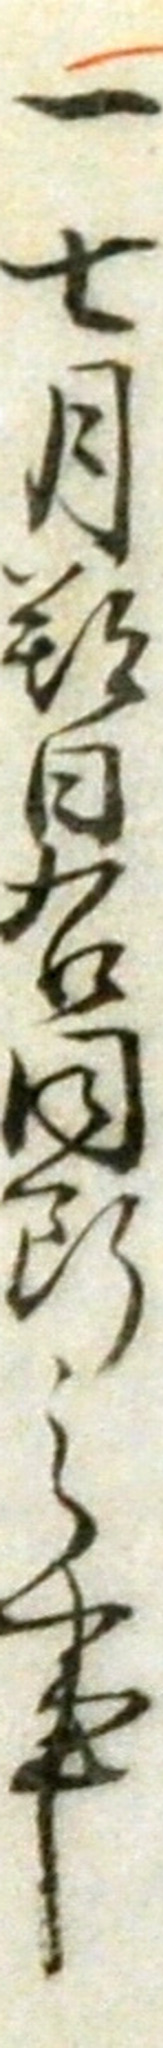一二月朔日右同断之事

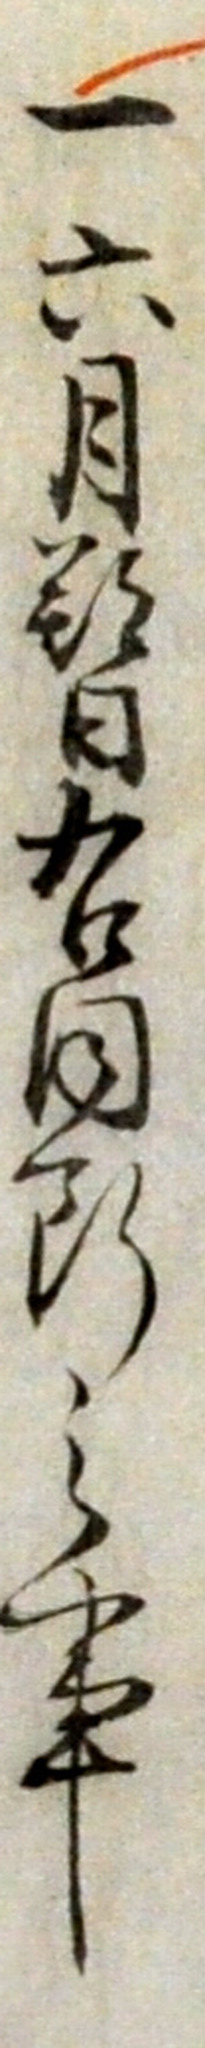一七月朔日右同断之事
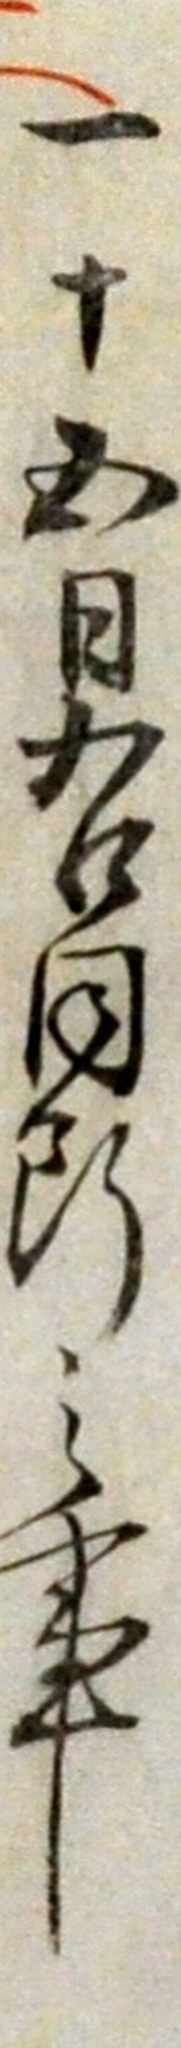一十五日右同断之事
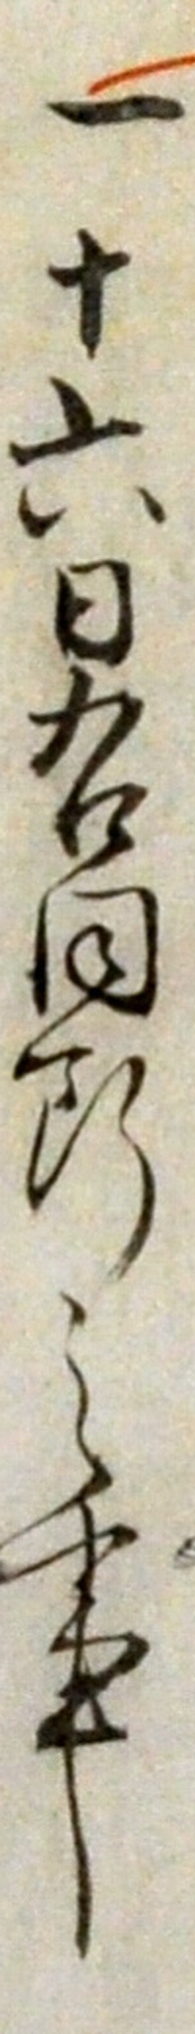一十五日右同断之事
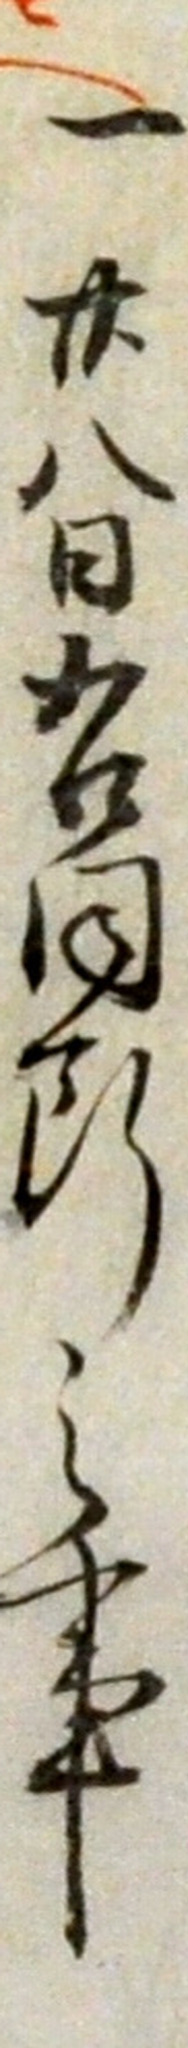一廿八日右同断之事
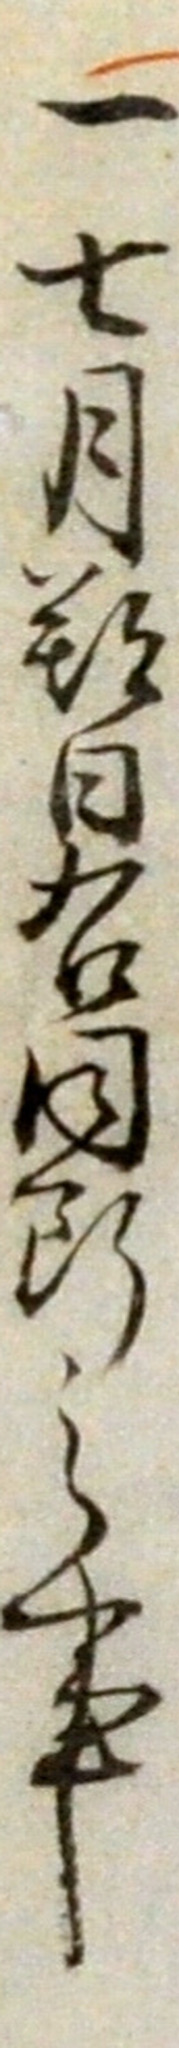一七月朔日右同断之事
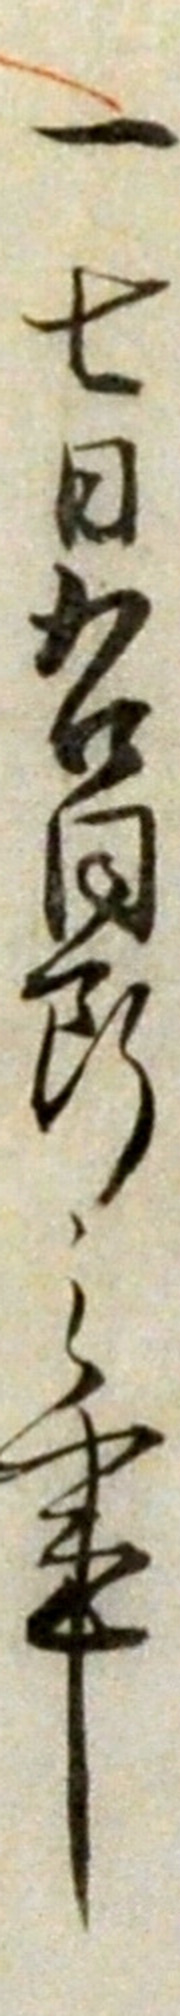一七日右同断之事
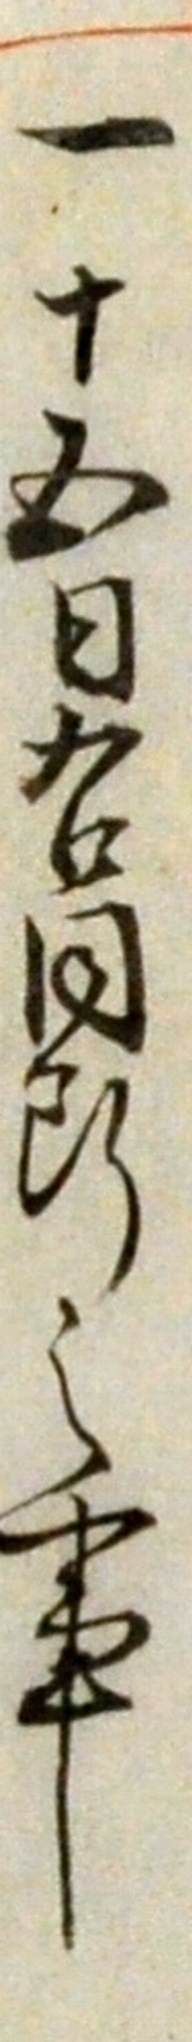一十五日右同断之事
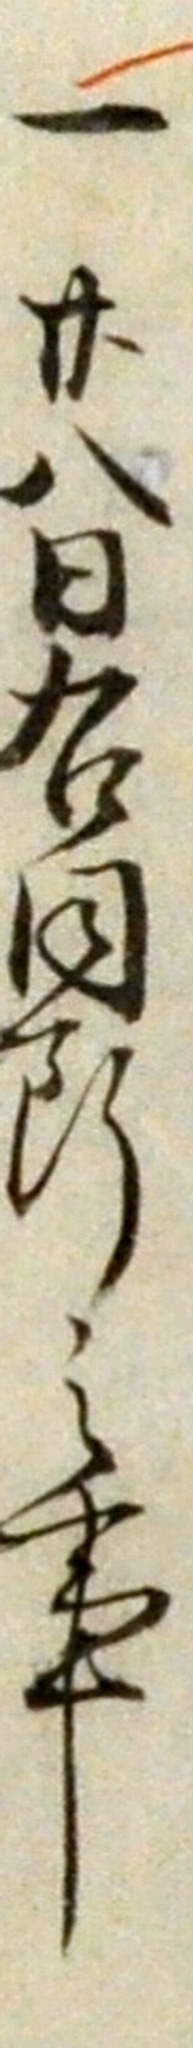一廿八日右同断之事
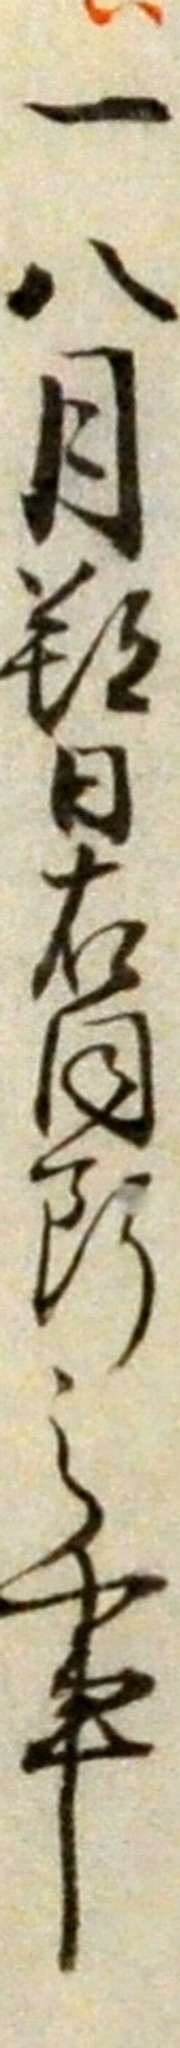一八月朔日右同断之事
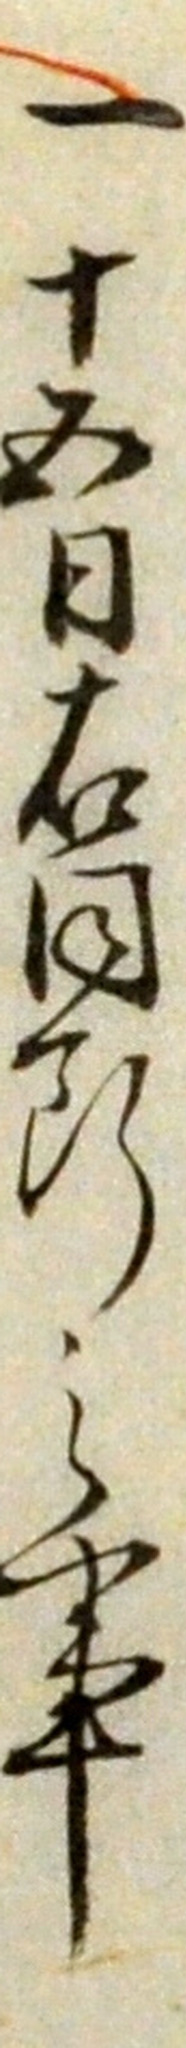一十五日右同断之事
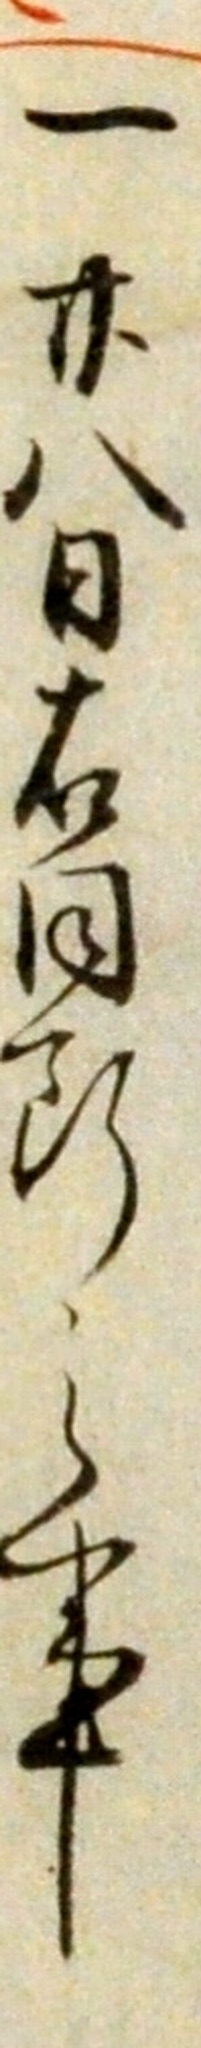一廿八日右同断之事
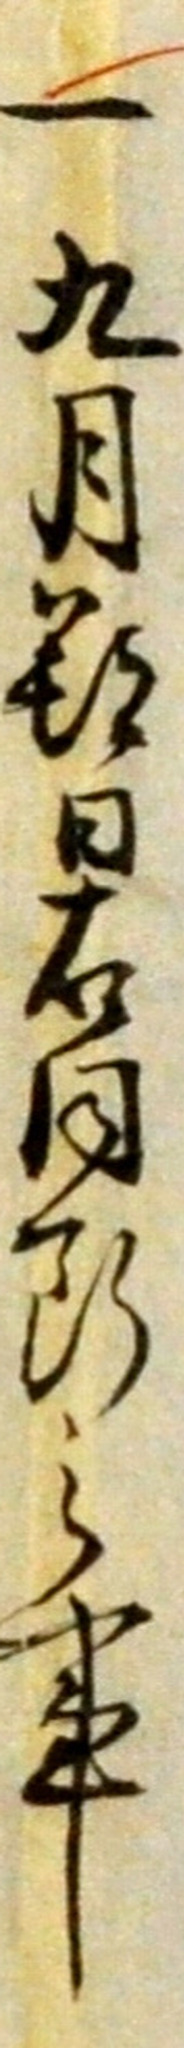一九月朔日右同断之事
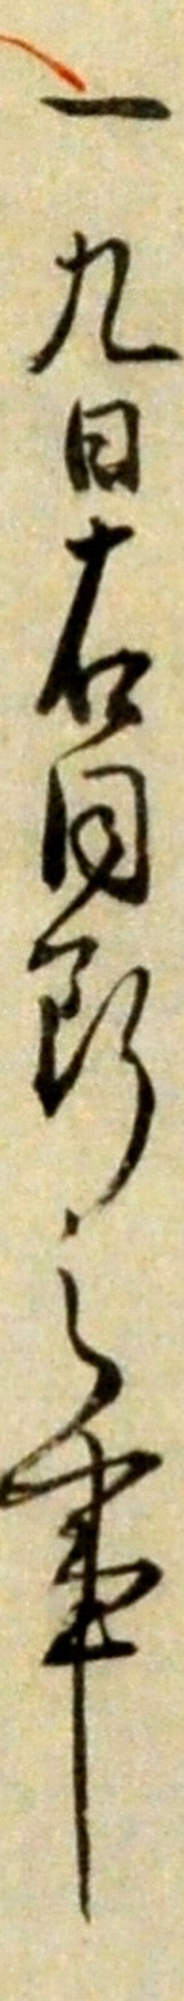一九日右同断之事
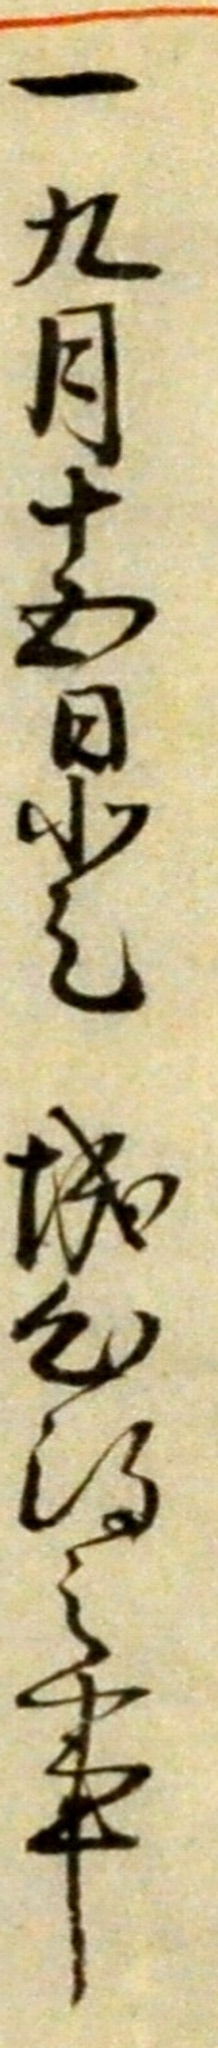一九月十五日登城心得之事
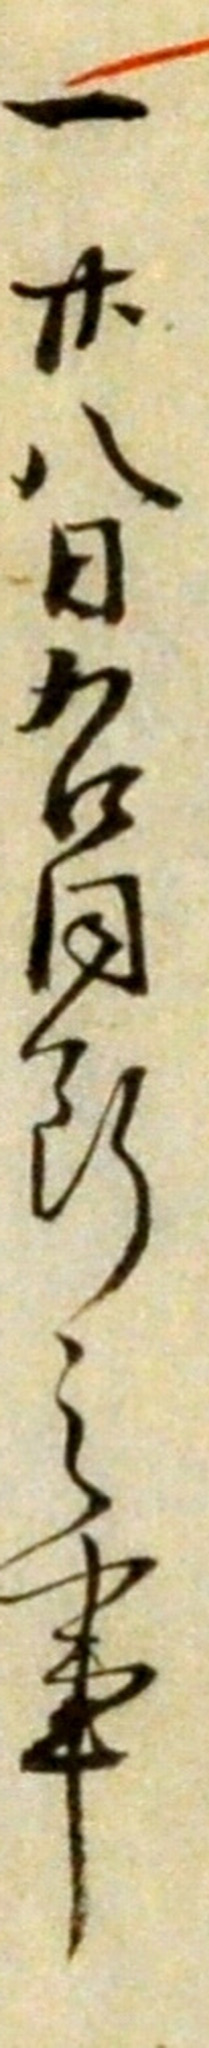一廿八日右同断之事
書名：申合帳〔一括〕
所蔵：伊那市立高遠町図書館・合同会社AMANE
